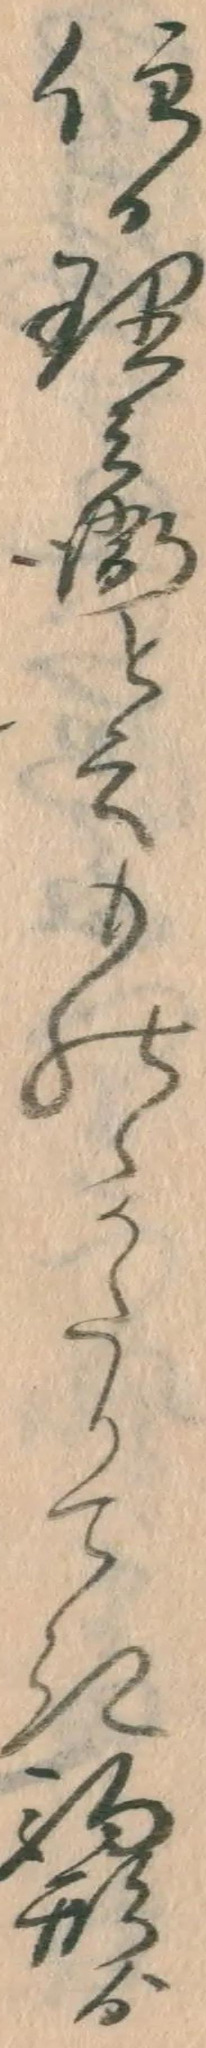住る理兵衛と云ものゝかたりてき駒形ゟ
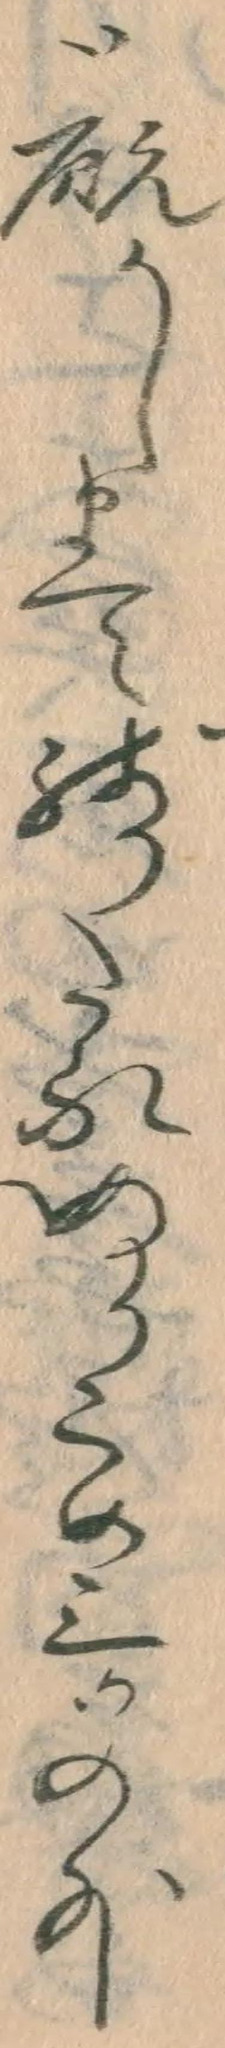御厩かしまて残りたるぬりこめ三ツの外
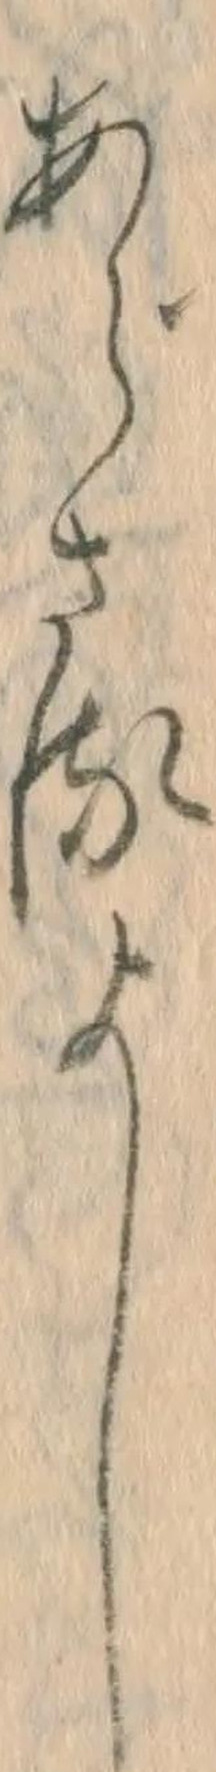あらさるよし
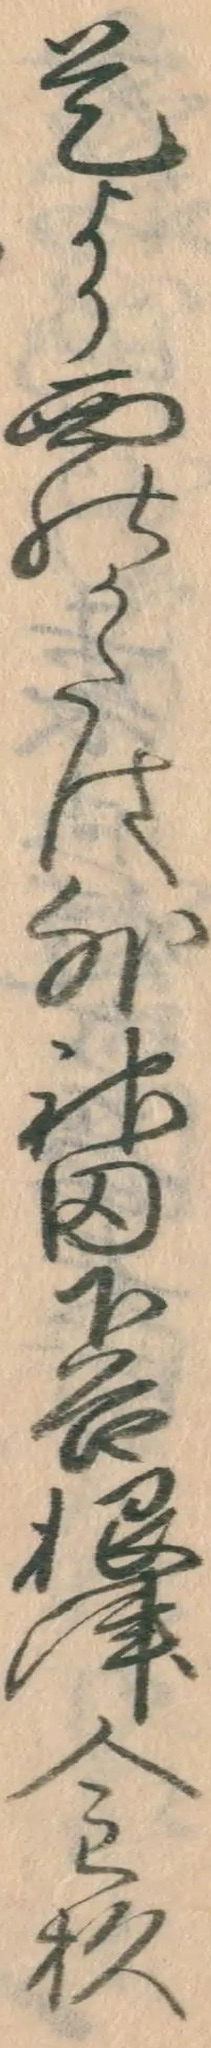是より西のかたは外神田下谷根津金杉
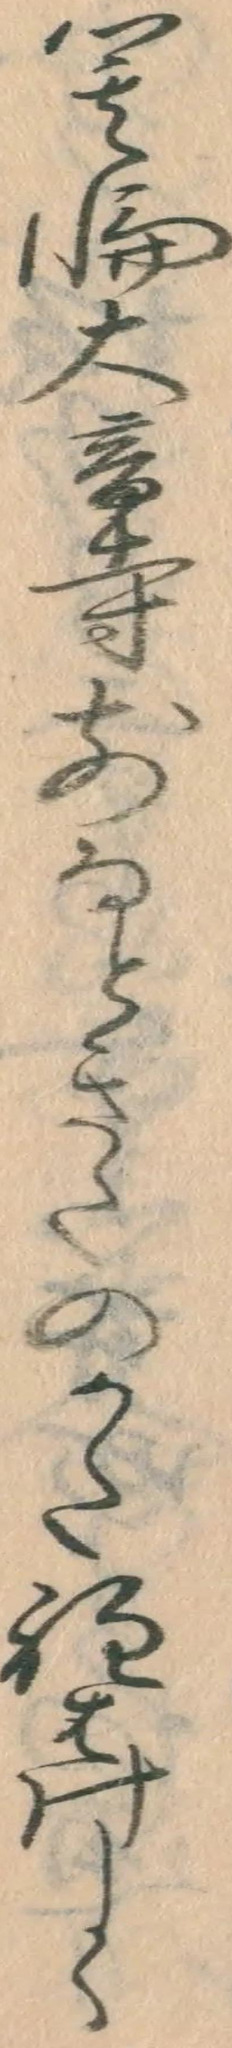箕輪大音寺前なときたのかた程はけしく
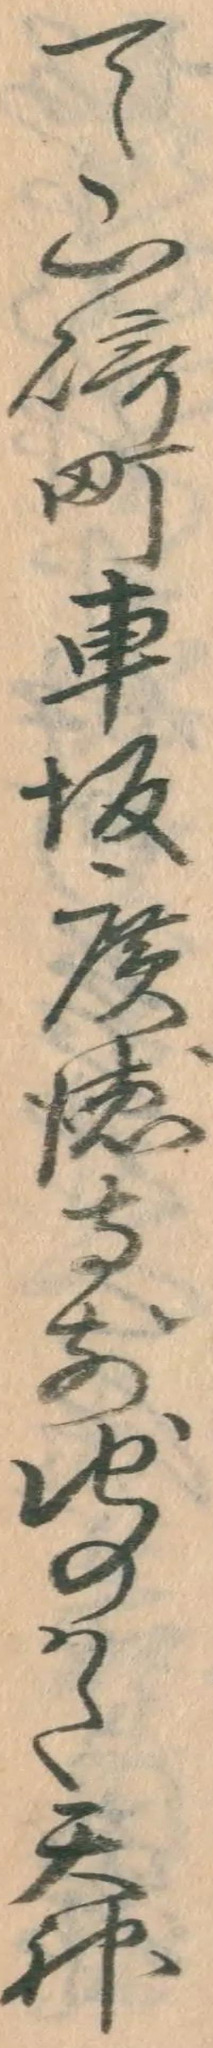て山崎町車坂廣徳寺前池のかた天神

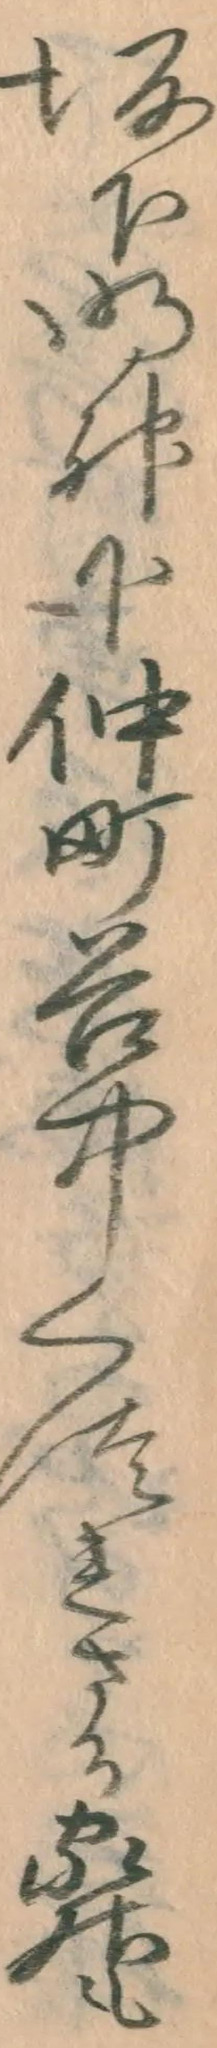坂下明神下仲町谷中くつれたる家居も
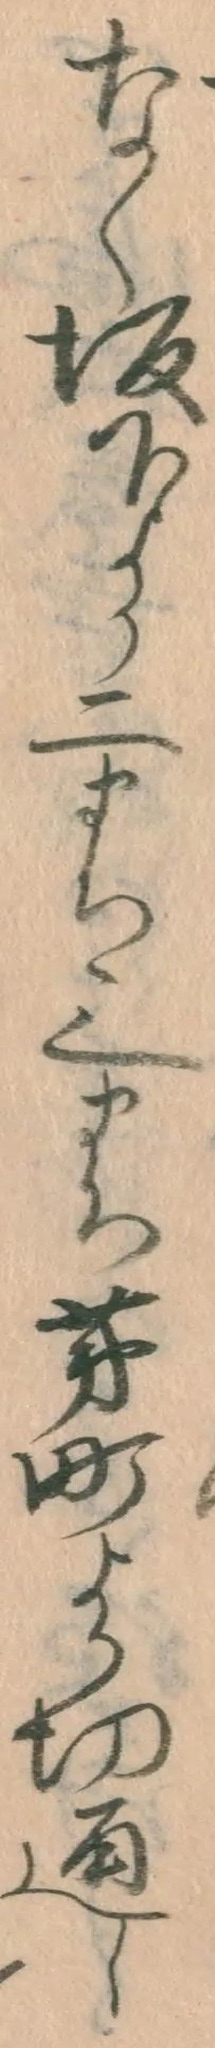なく坂下より二まち三まち茅町より切通し
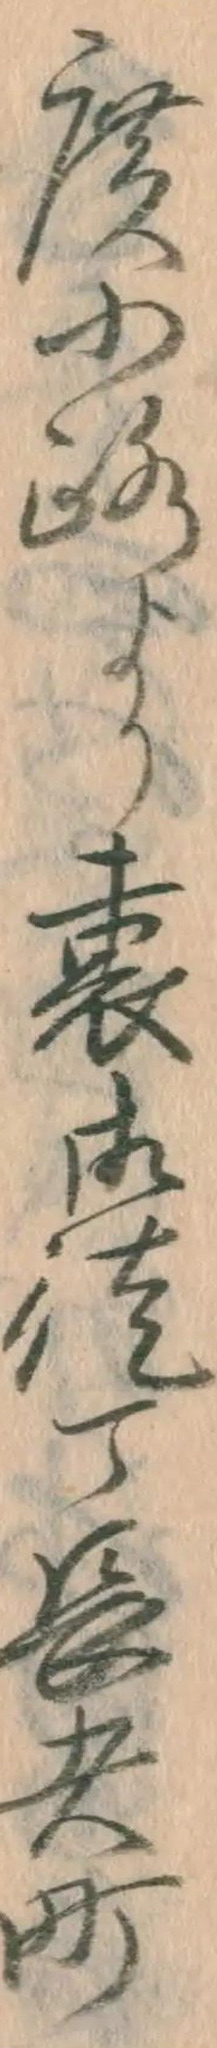廣小路より裏御徒丁長者町
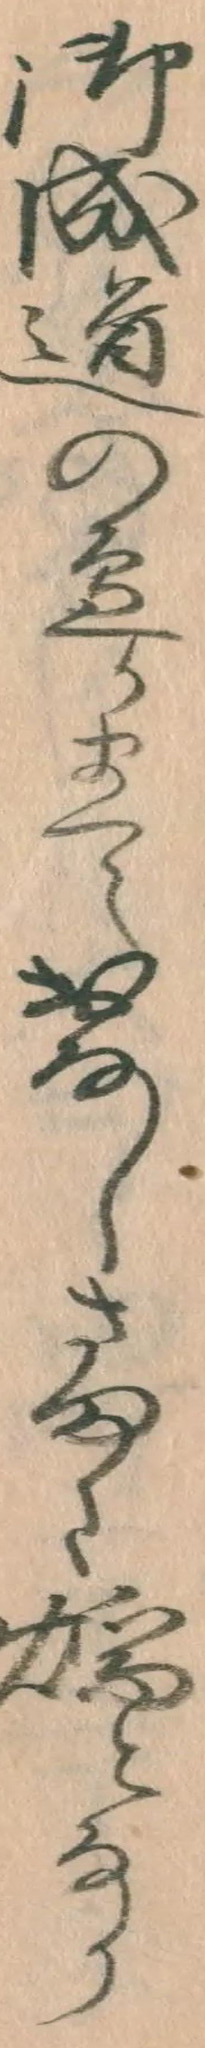御成道の邊りまておなしさまに焰となり
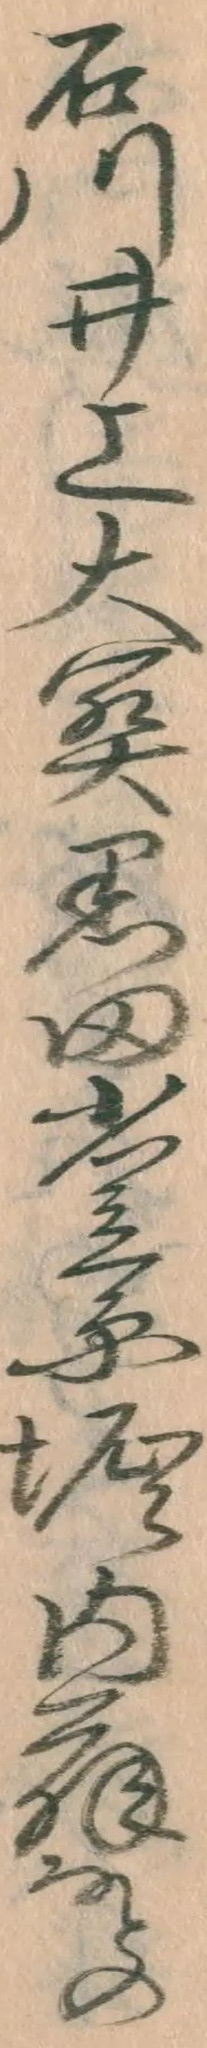石川井上大関黒田小笠原堀内藤なとの
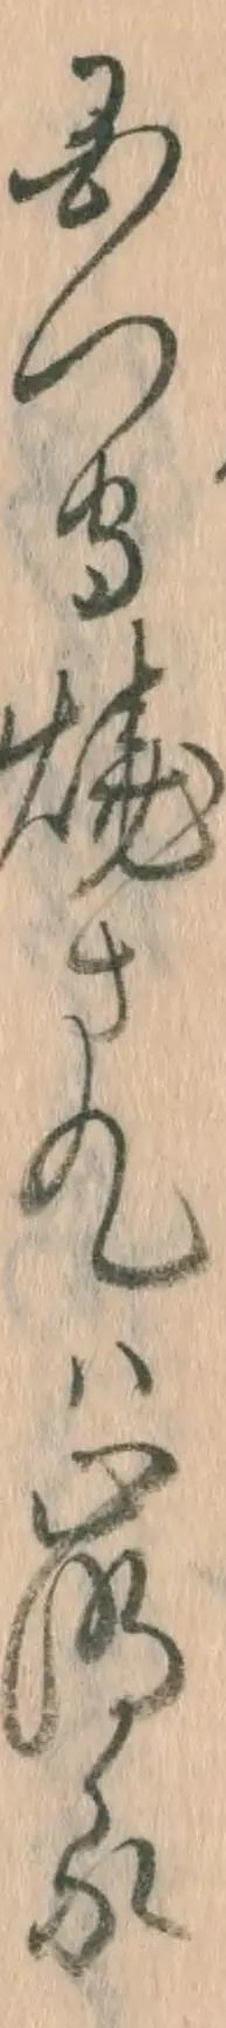国つ守燒されハ崩る
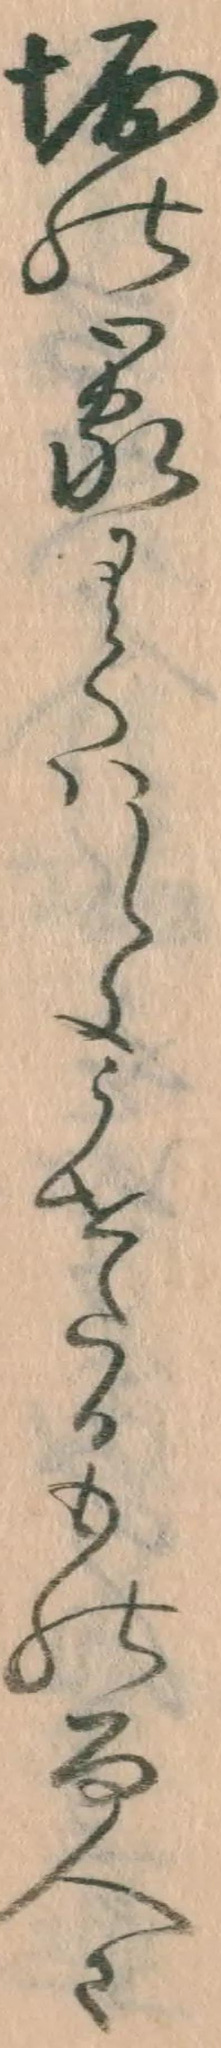堀の御家にてハしにらせたるもの百人に
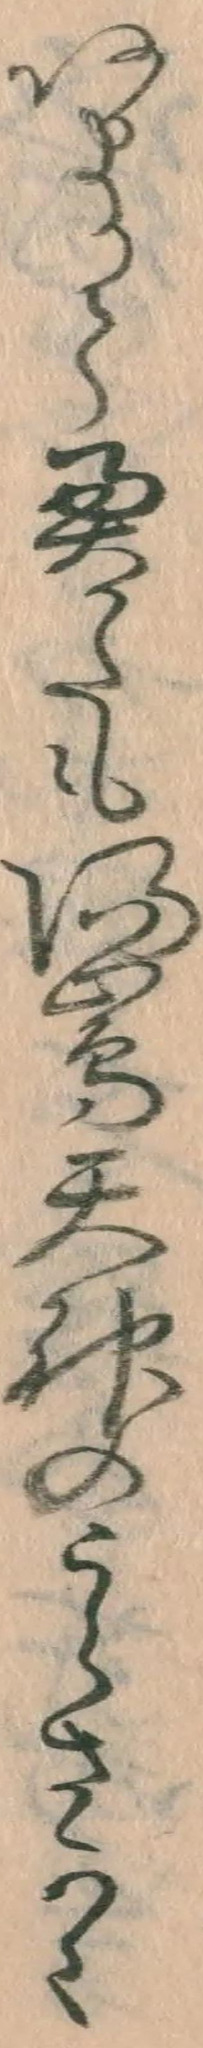あまりて奥かたも湯嶋天神のうらさかに
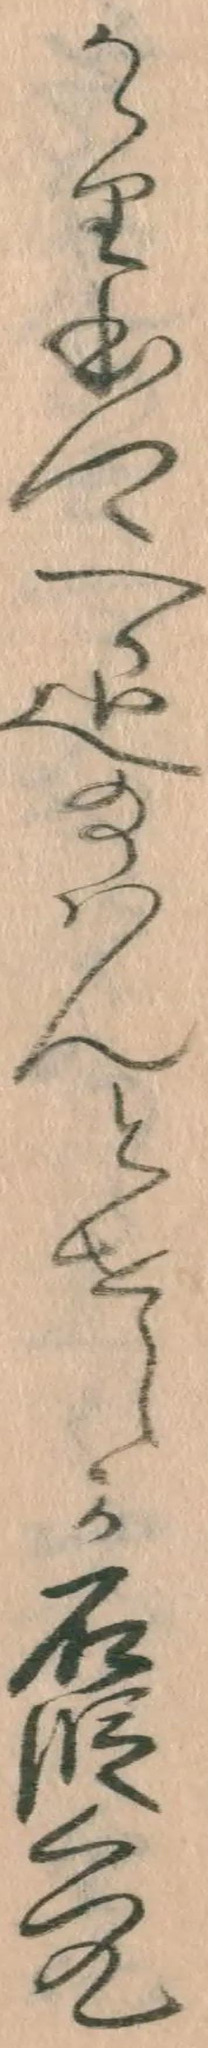かヽり本郷へ退玉ハんとせしか石段くつれ
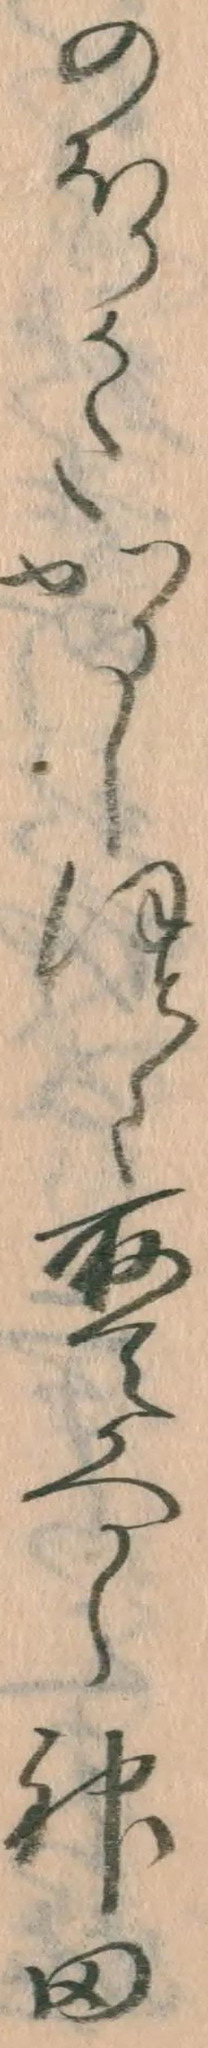のほりかたかりしほとに取てかへし神田
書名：麗斎叢書. 20
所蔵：国立国会図書館 National Diet Library, JAPAN
